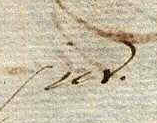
jur.
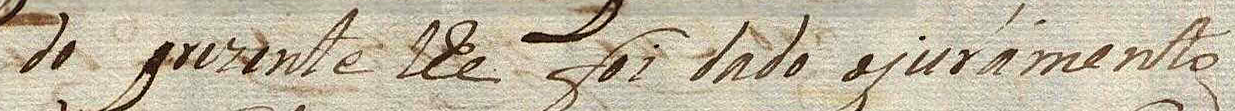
do prezente lhe foi dado o juramentto
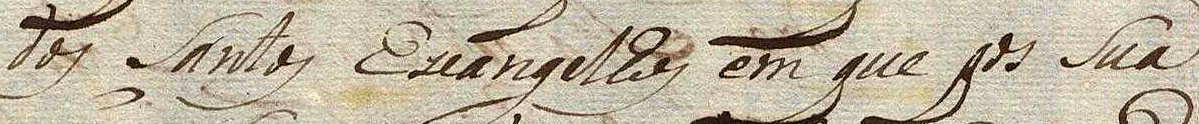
dos Santos Evangelhos em que pos sua
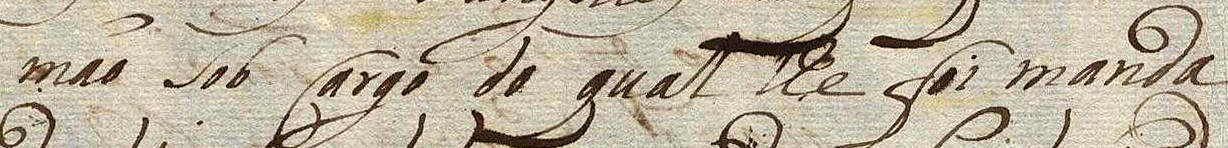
maõ sob Cargo do qual lhe foi manda
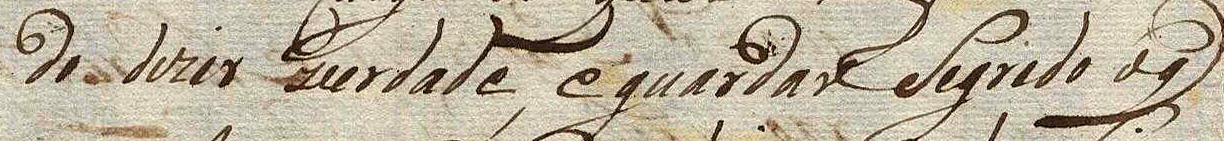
do dizer verdade, e guardar Segredo o q̄
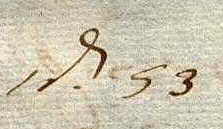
id.e 53
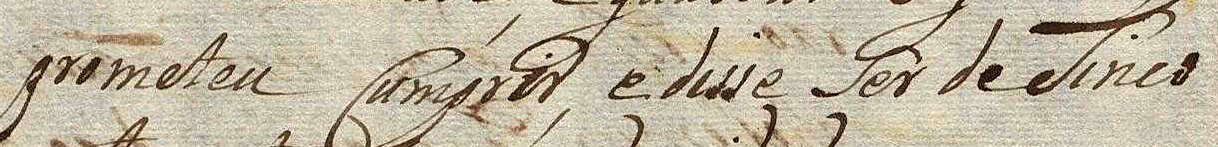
prometeu Cumprir, e disse Ser de sinco
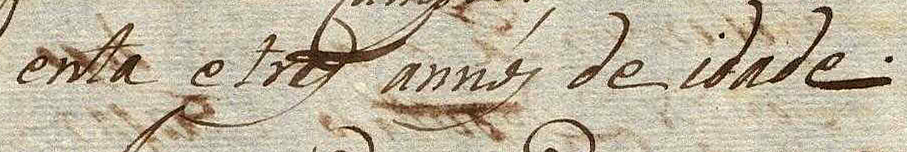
enta e tres annos de idade.
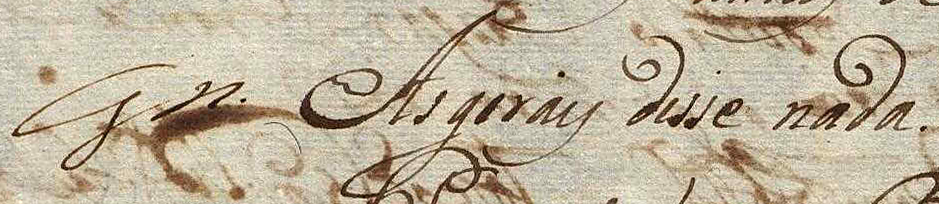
Gn. As gerais disse nada
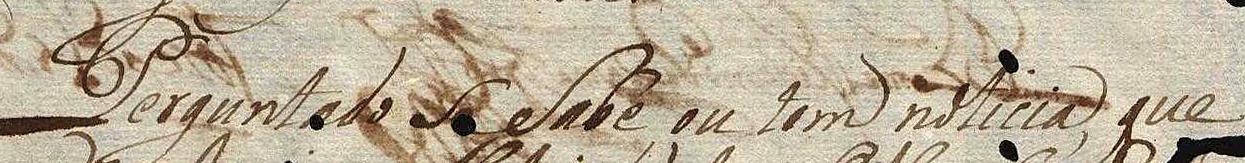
Perguntado se sabe, ou tem noticia, que
